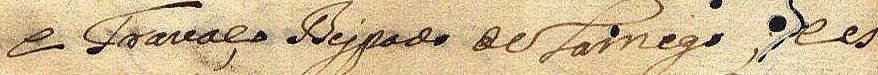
e Travaço Bispado de Lamego; e es
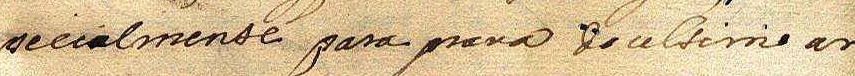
pecialmente para prova do ultimo ar
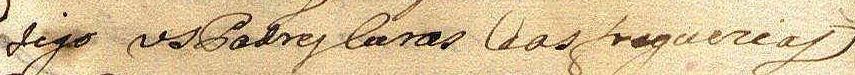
tigo os Padres Curas das freguezias
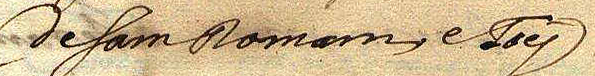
de sam Romam e Toẽs
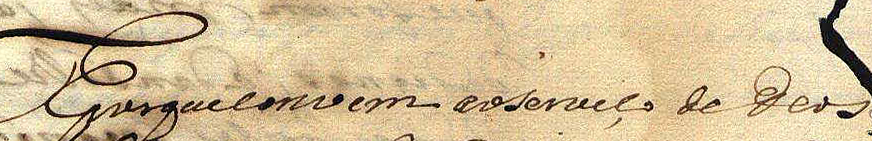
E porque convem ao serviço de Deos
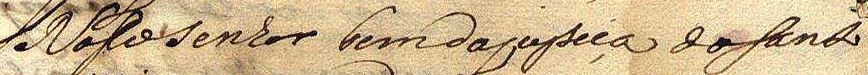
Nosso senhor bem da justiça do santo
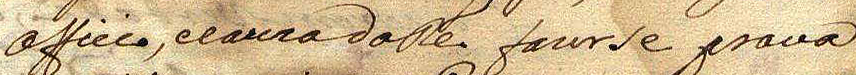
officio, e cauza da Re fazerse prova
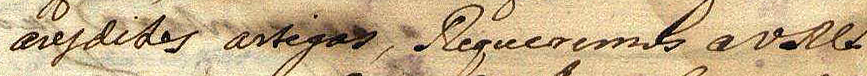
aos ditos artigos, Requeremos a v Ms
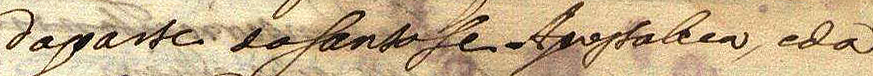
da parte da santa se Apostolica, e da
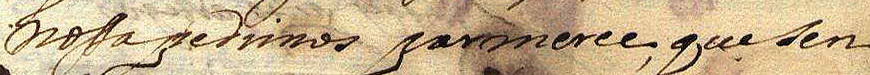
nossa pedimos por merce, que sen
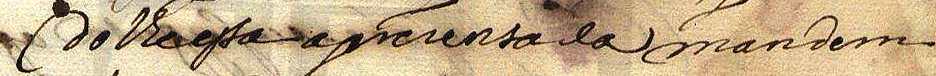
do lhe esta aprezentada mandem
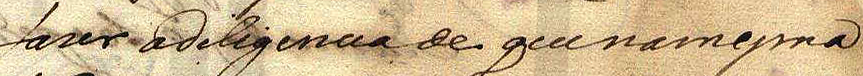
fazer a diligencia de que na mesma
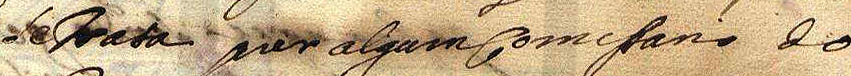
se trata por algum Comissario do
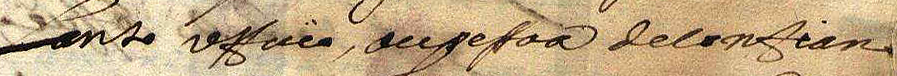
Santo officio, ou pessoa de confian
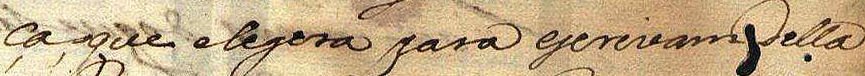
ça, que elegera para escrivam della
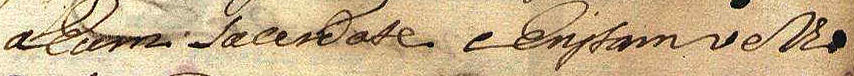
a hum sacerdote christam velho
